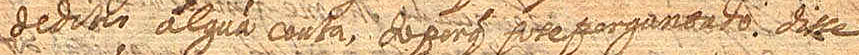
de dizer alguā couza, do por q̄ fose perguntado. disse
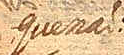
que naõ:
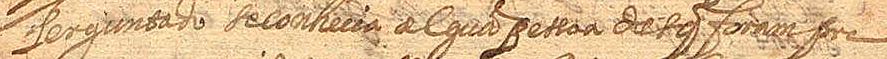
Perguntado se conhecia alguā pessoa das q̄ foram pre
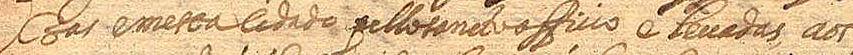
zas em esta çidade pello sancto offiçio e leuadas, aos
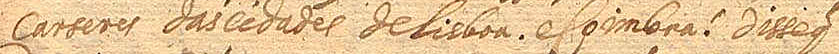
carseres das çidades de lisboa. e Coimbra? disse q̄
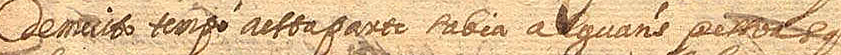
de muito tempo a esta parte sabia a alguans pessoas q̄
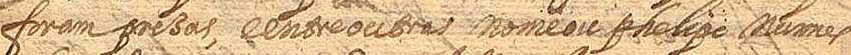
foram prezas, e entre outras nomeou phelipe nunnes
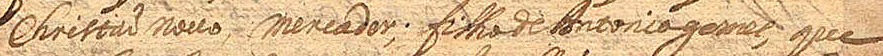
Christaõ nouo, mercador; filho de Antonio gomes, que
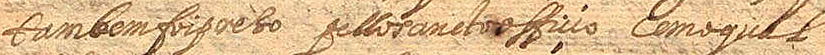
tambem foi prezo pello sancto offiçio com o qual
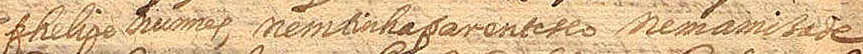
phelipe nunnes, nem tinha parentesco nem amizade
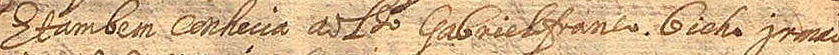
E tambem conheçia ao Ldo Gabriel franco. bicho jrmaõ
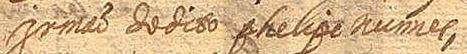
jrmaõ do dito phelipe nunnes,
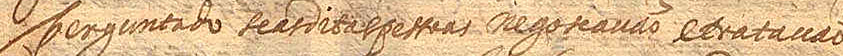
Perguntado se as ditas pessoas negoseauaõ e tratauaõ
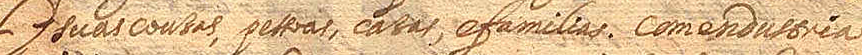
suas couzas, pessoas, cazas, e familias. com endustria
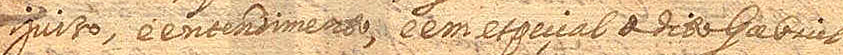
juizo, e entendimento, e em espeçial o dito Gabriel
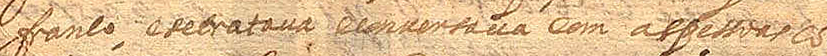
franco, e se trataua e conuersaua com as pessoas cō
